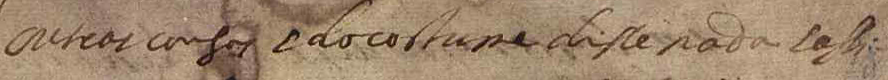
outras cousas E do costume disse nada E assi
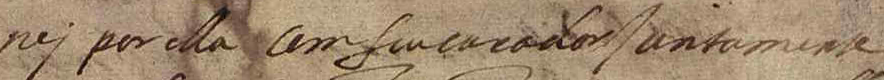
nej por ella com seu curador Juntamente
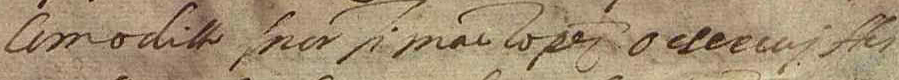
Com o ditto Snor̄ Simão Lopes o escrevi Hei
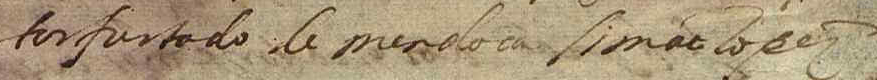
tor furtado de mendoca Simão Lopēz
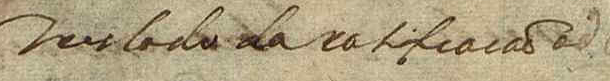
Treslado da ratificacaõ ad
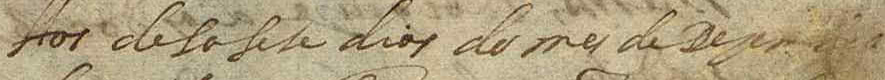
Aos desasete dias do mes de Dezembro
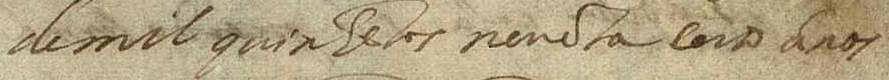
de mil quinh̄etos nouēta e oito an̄os
